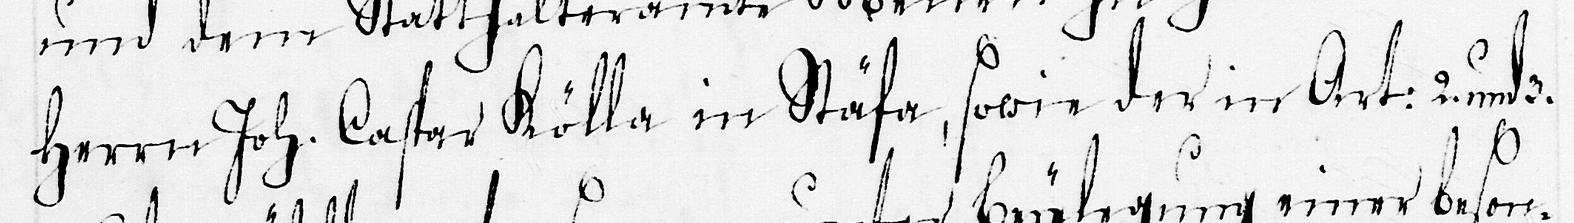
Herrn Joh. Caspar Kölla in Stäfa, sowie der in Art: 2. u¬
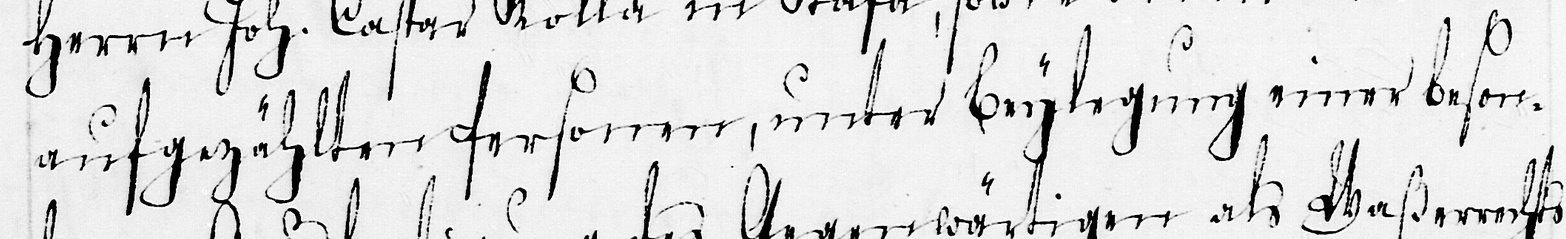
aufgezählten Personen, unter Beylegung einer beson¬
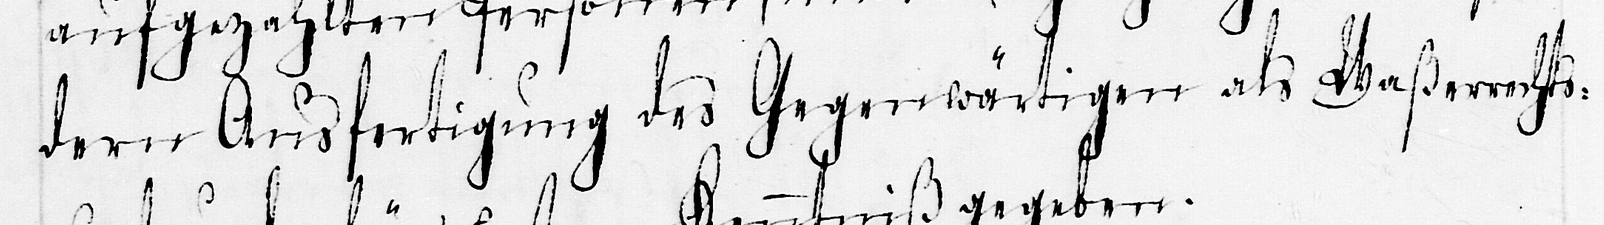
dern Ausfertigung des Gegenwärtigen als Waßerrechts¬
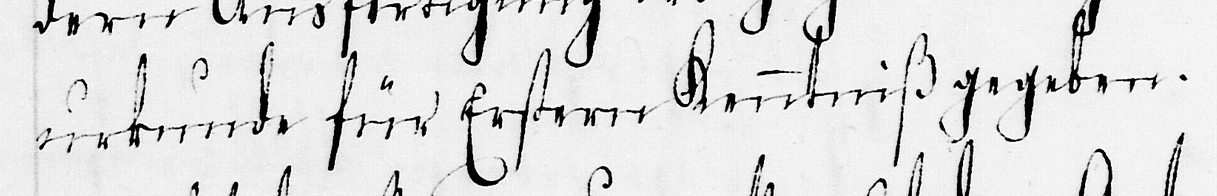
urkunde für Erstern Kenntniß gegeben.
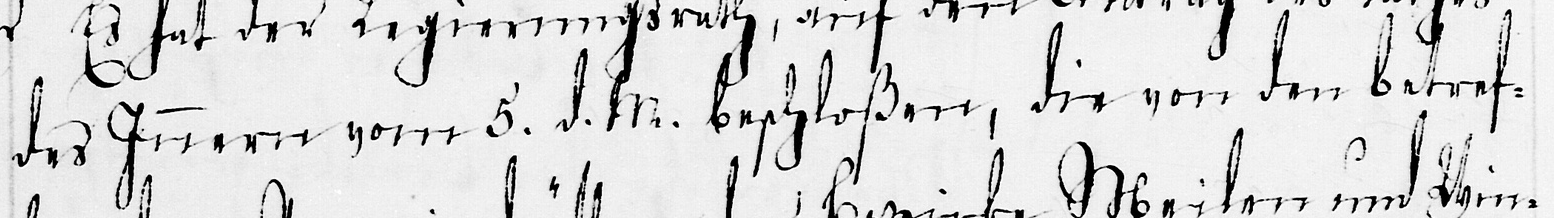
des Innern vom 5. d. M. beschloßen, die von den betref¬
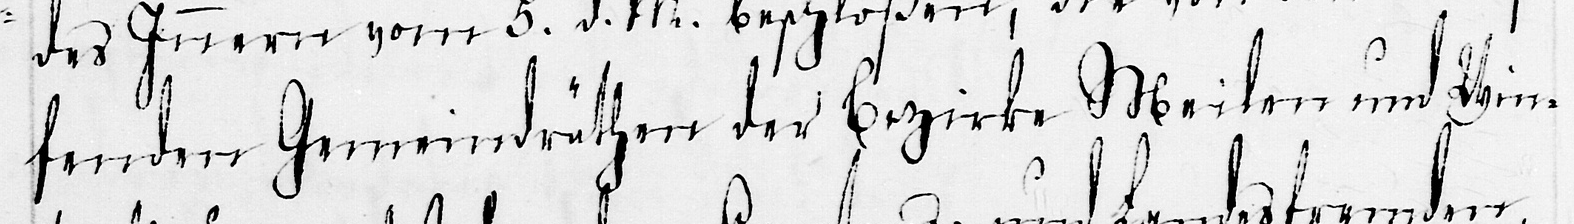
fenden Gemeindräthen der Bezirke Meilen und Win¬
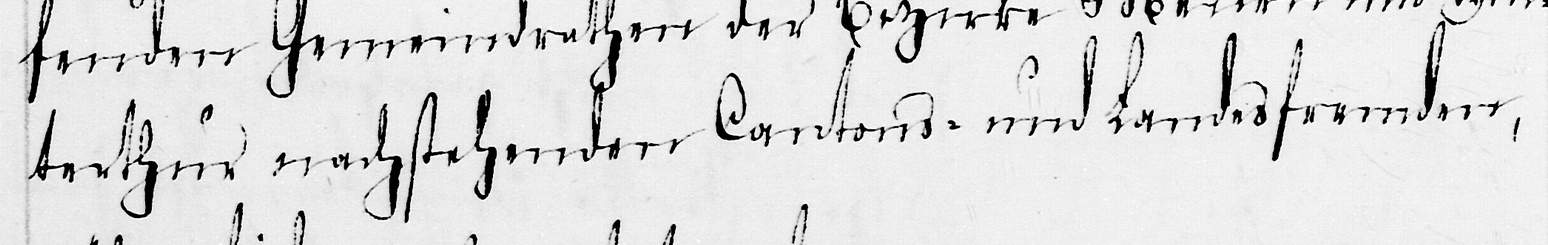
terthur nachstehenden Cantons- und Landesfremden,
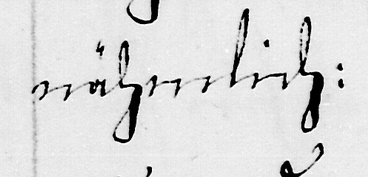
nähmlich:
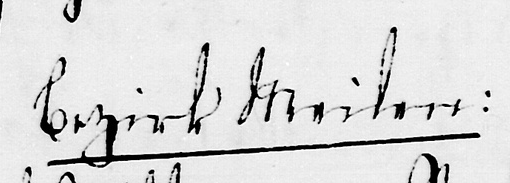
Bezirk Meilen:
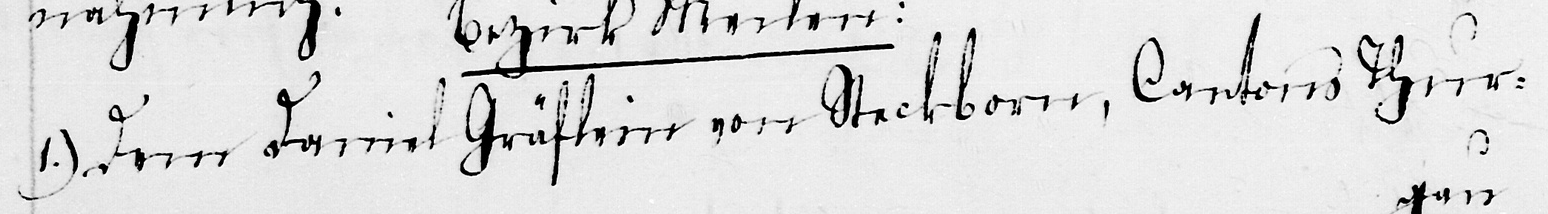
1.) Dem Daniel Gräflein von Steckborn, Cantons Thur-
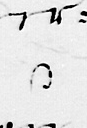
3.
